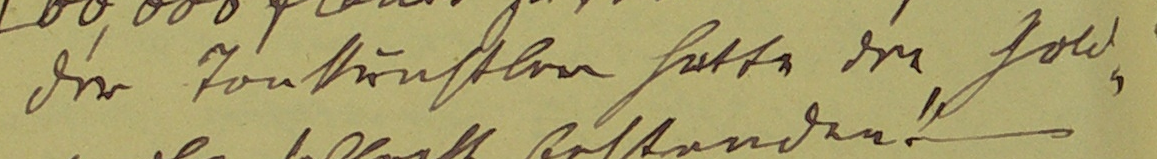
der Tonkünstler hatte die Gold¬
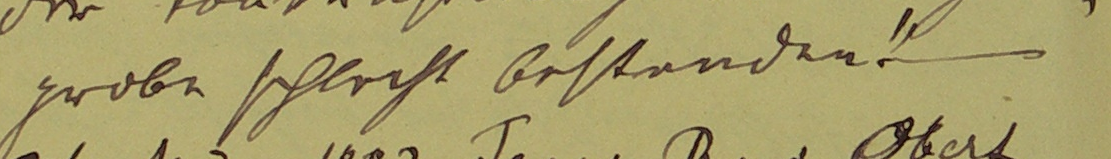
probe schlecht bestanden. ! -
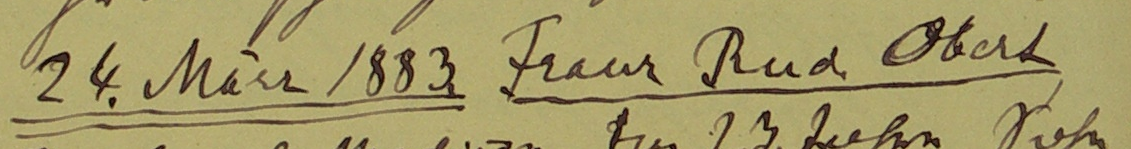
24. März 1883. Franz Rud. Obert,
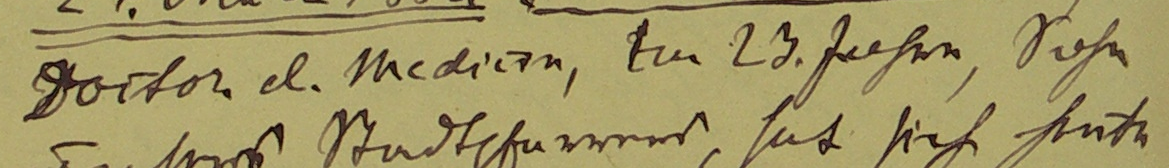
Doctor der Medicin, im 23. Jahre, Sohn
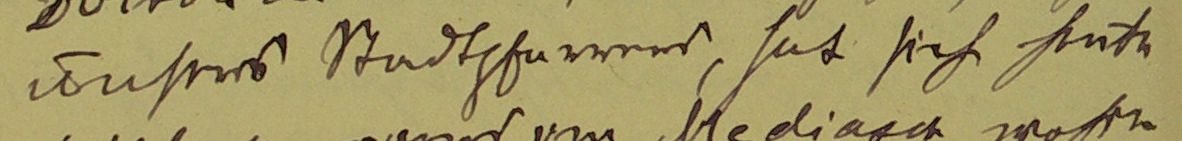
unseres Stadtpfarrers, hat sich heute
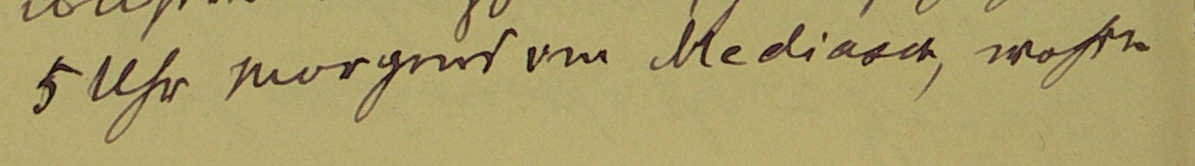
5 Uhr morgens in Mediasch, wohin
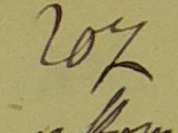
207
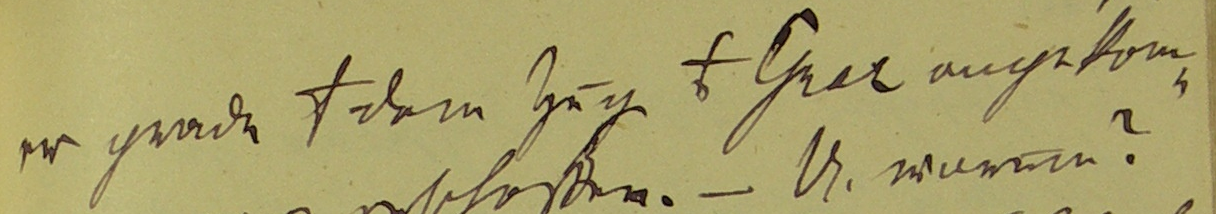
er gerade mit dem Zug aus Graz angekom¬
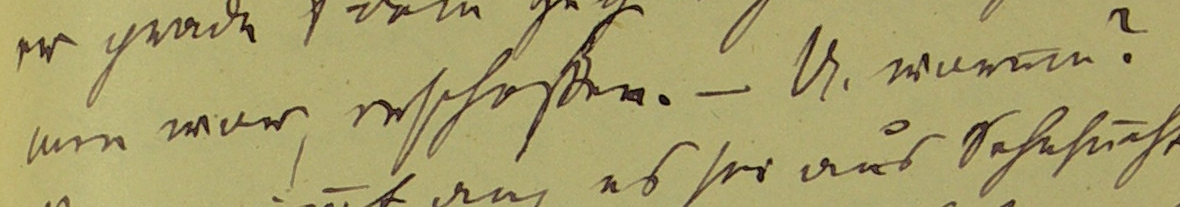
men war, erschossen.- Und warum ?
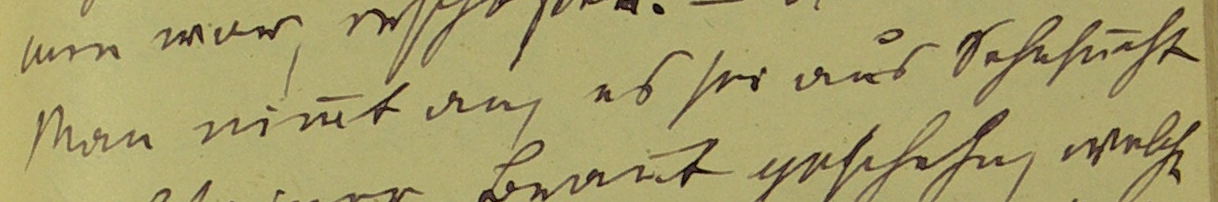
man nimmt an, es sei aus Sehnsucht
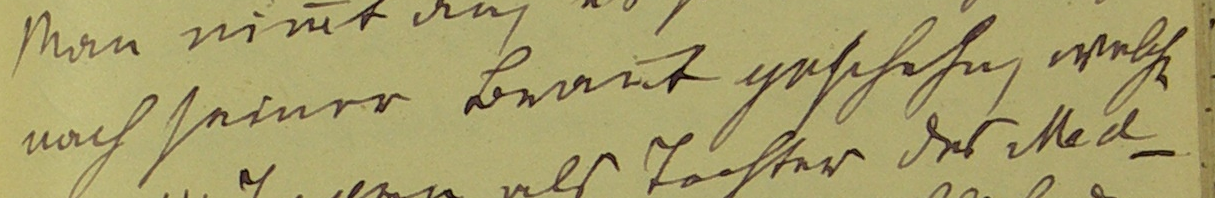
nach seiner Braut geschehen, welche
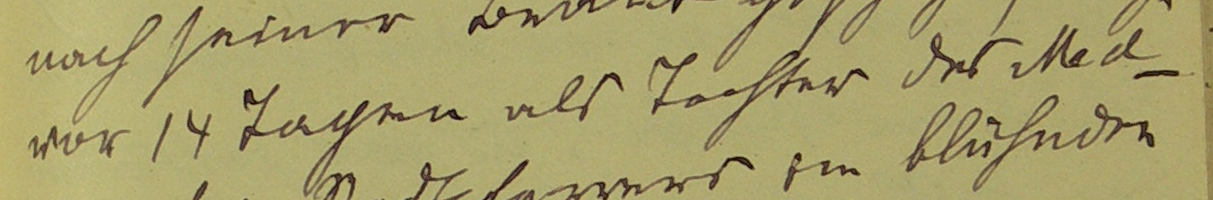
vor 14 Tagen als Tochter des Med¬
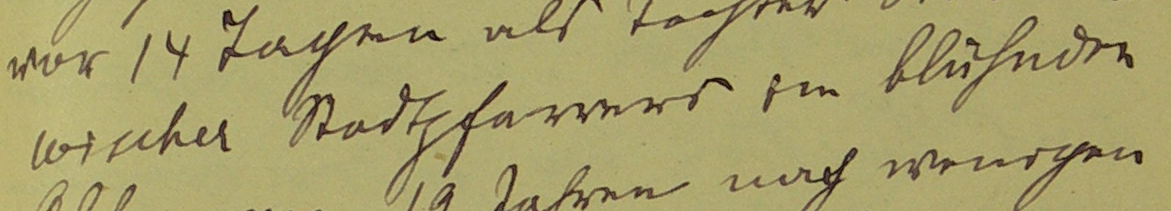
iascher Stadtpfarrers im
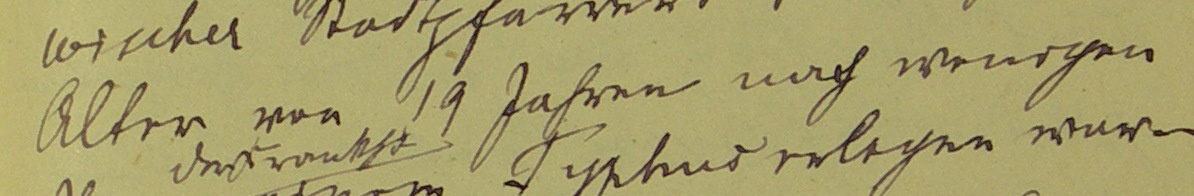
Alter von 19 Jahren nach wenigen
